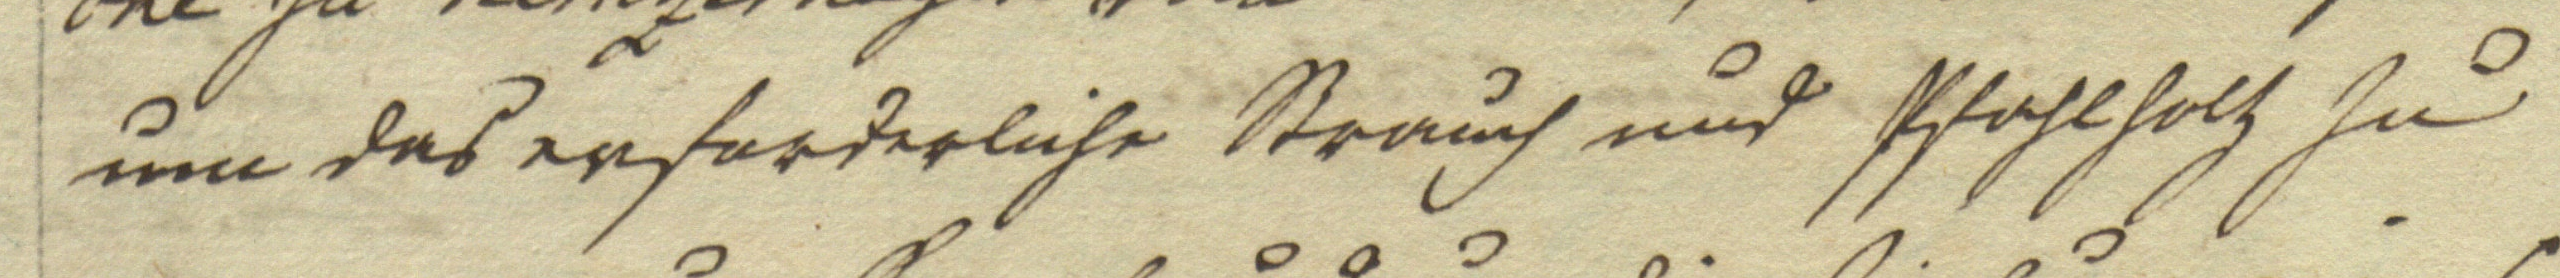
um das erforderlichen Strauch und Pfahlholz zu
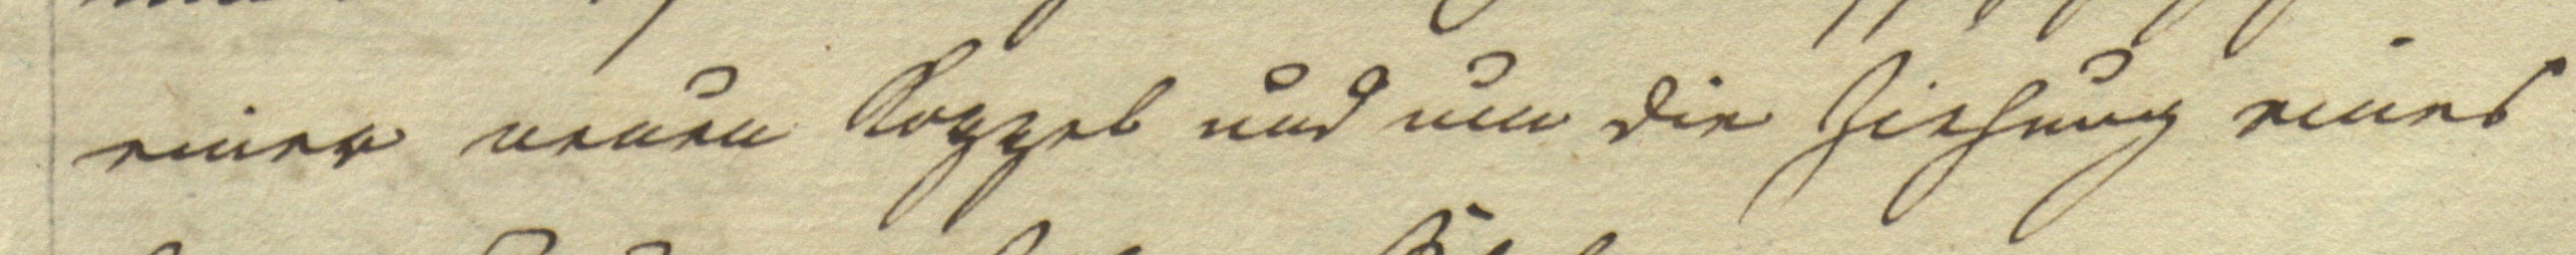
einer neuen Koppel und um die Ziehung eines
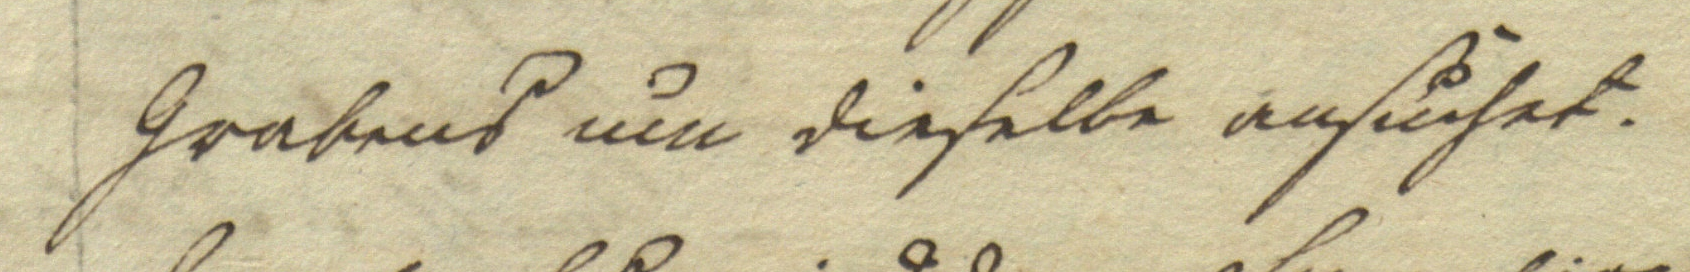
Grabens um dieselbe ansuchet.
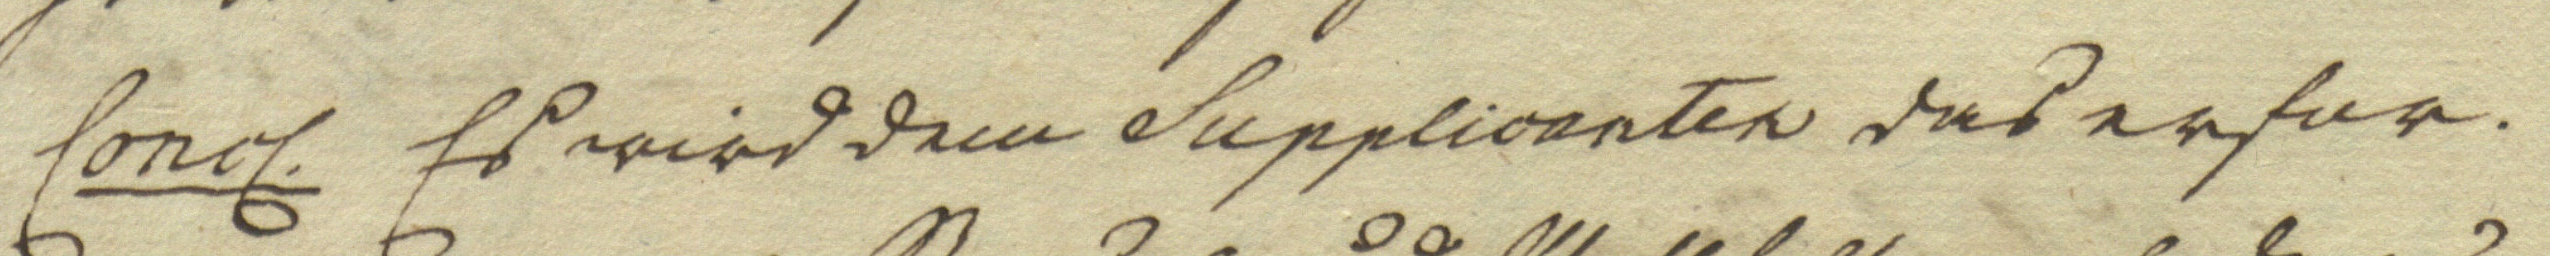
Concl. Es wird dem Supplicanten das erfor¬
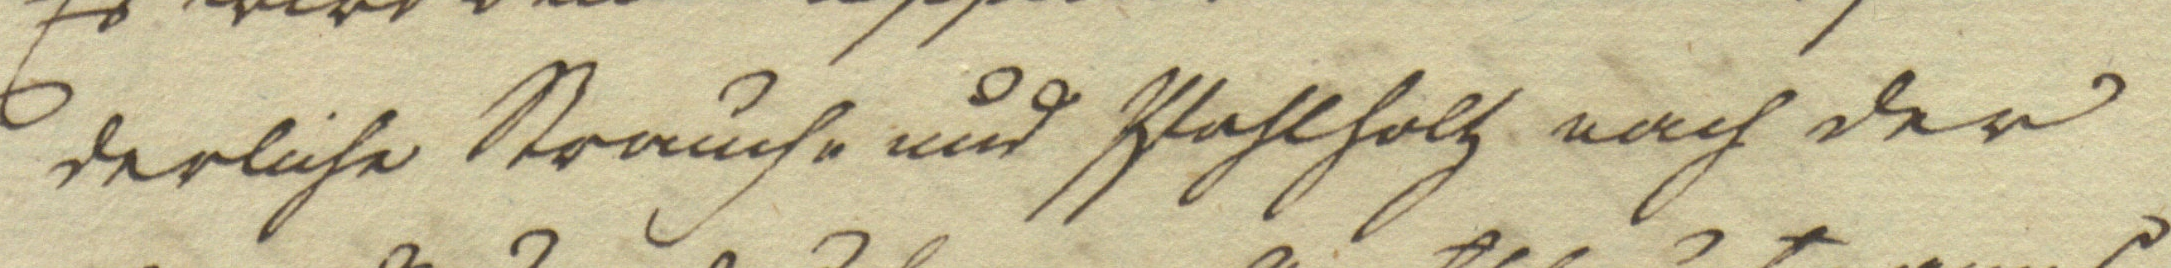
derliche Strauch- und Pfahlholz nach der
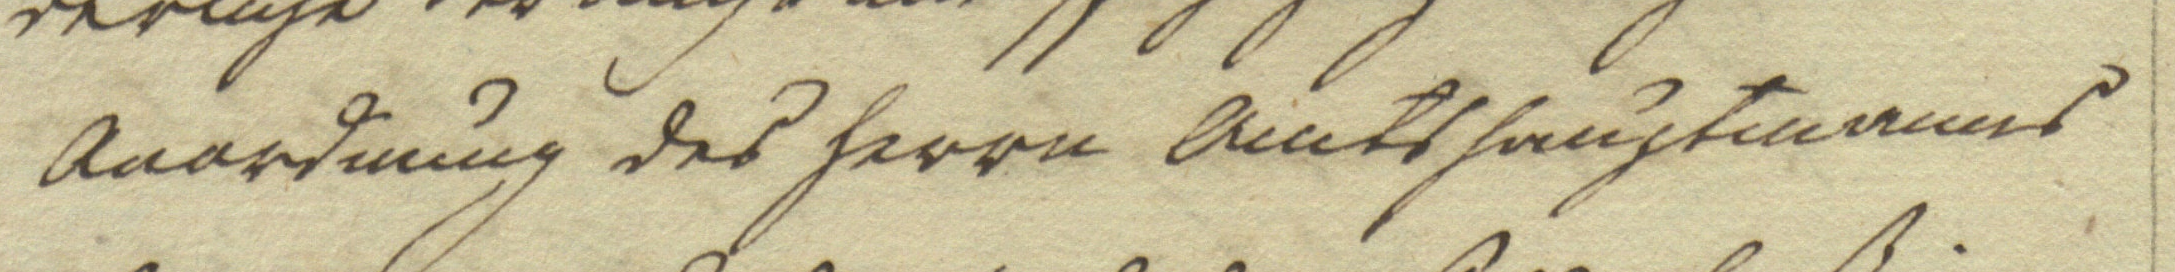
Anordnung des Herrn Amtshauptmanns
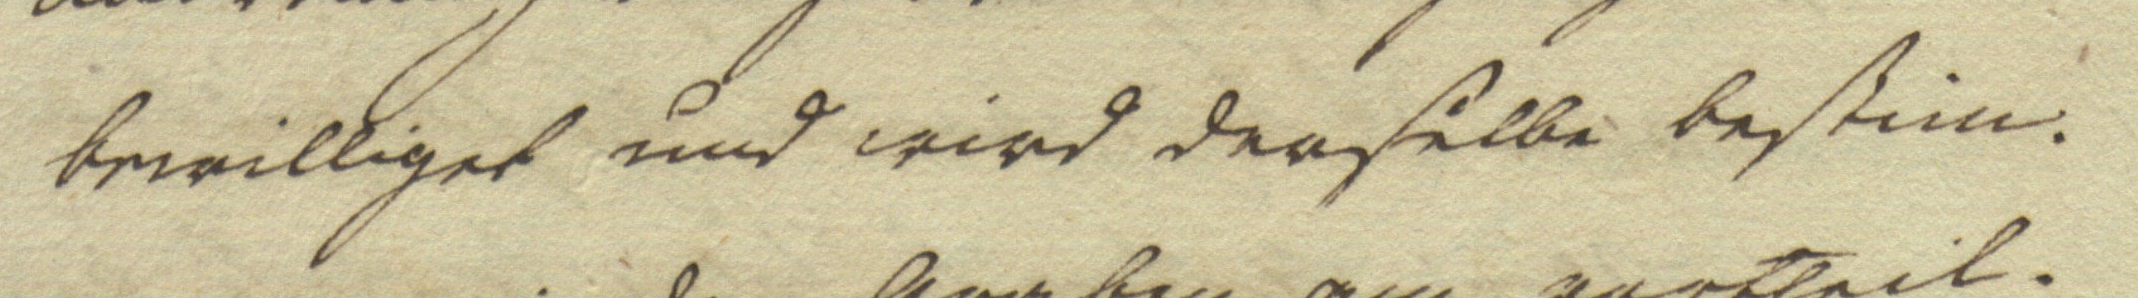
bewilliget und wird derselbe bestim¬
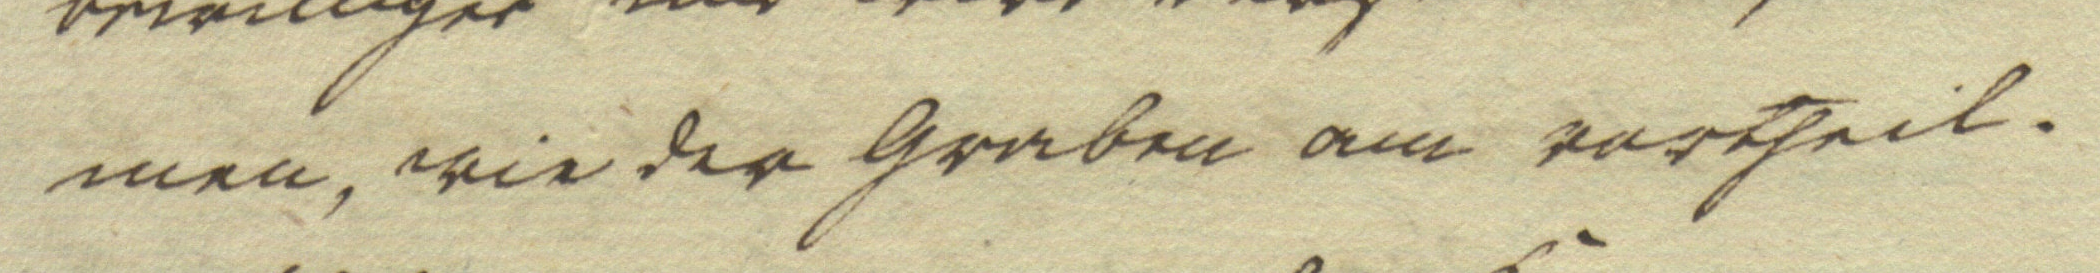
men, wie der Graben am vortheil¬
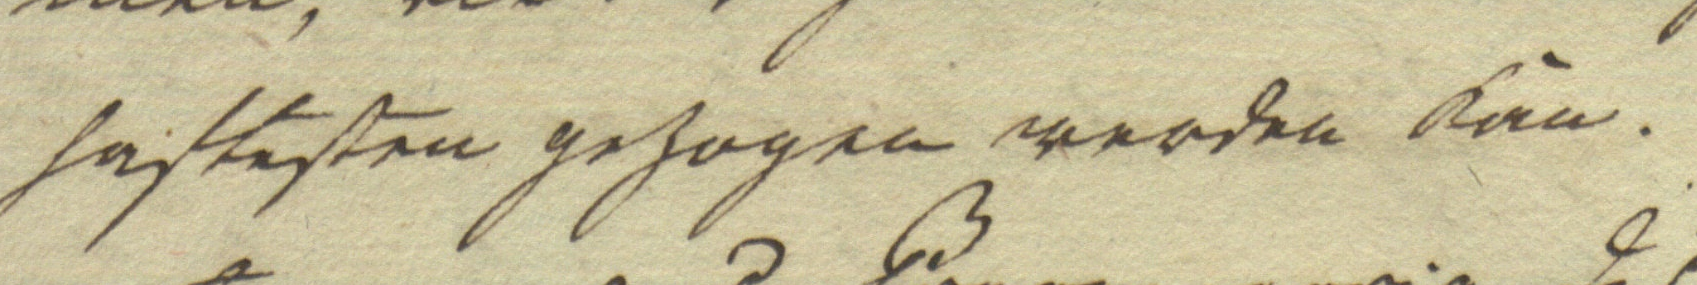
haftesten gezogen werden kan.
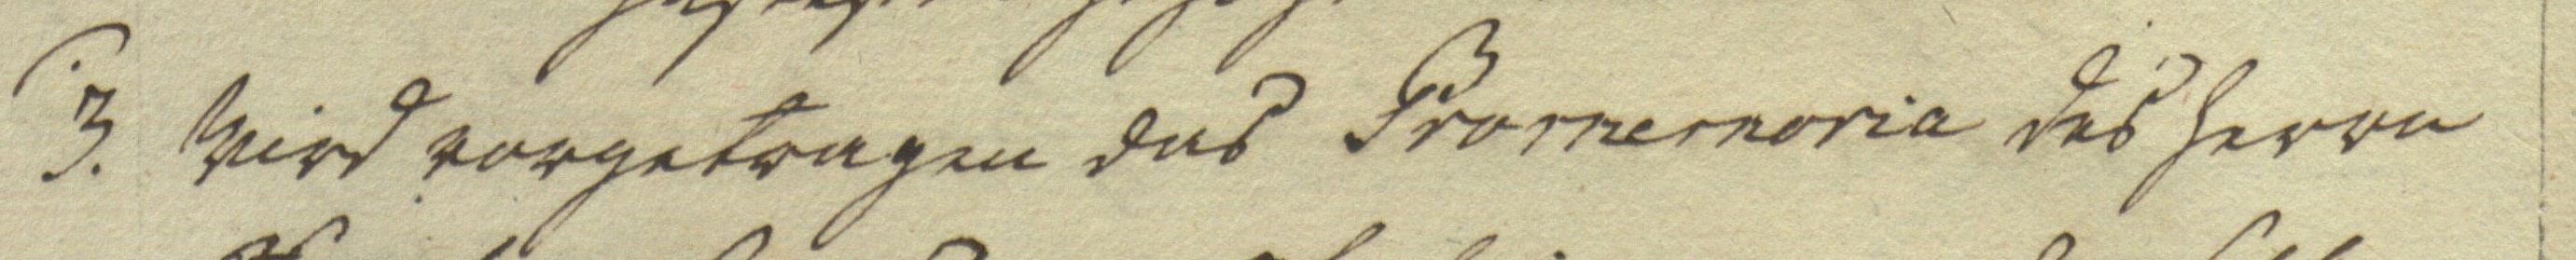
4. Wird vorgetragen das Promemoria des Herrn
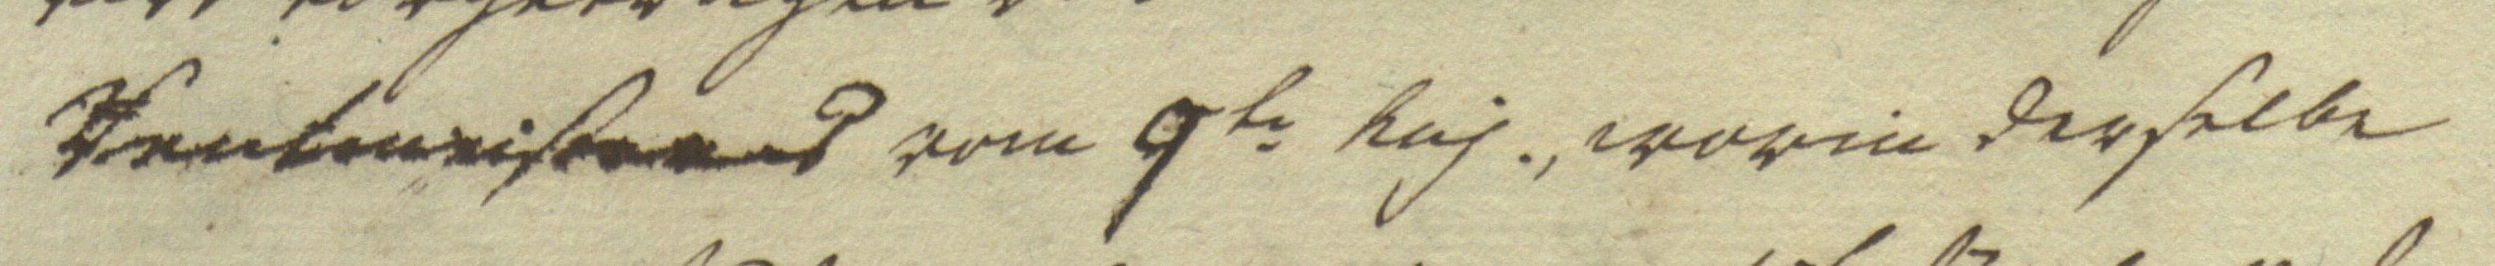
Rentmeisters vom 9 te huj., worin derselbe
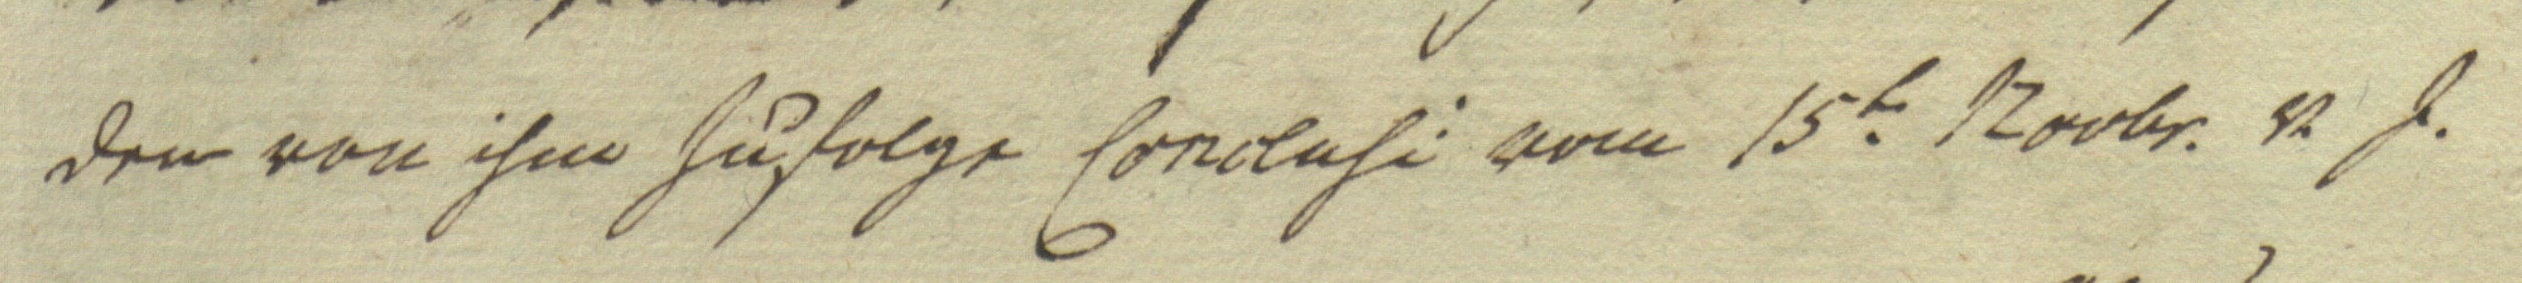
den von ihm zufolge Conclusi vom 15 t Novbr. v. J.
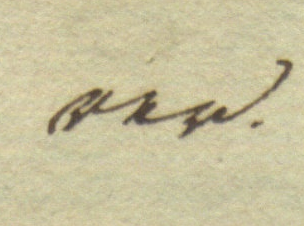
ver
